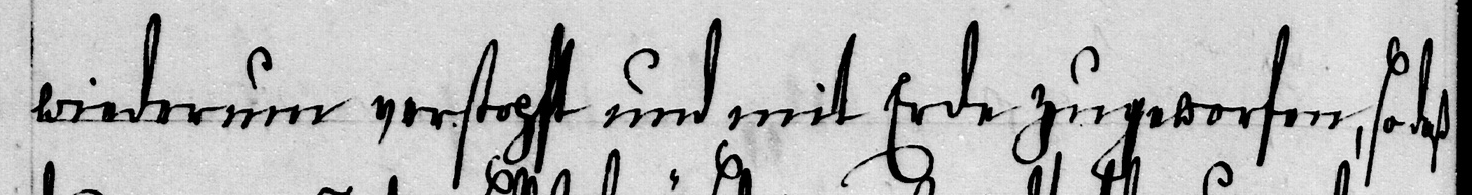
wiederum verstopft und mit Erde zugeworfen, so daß
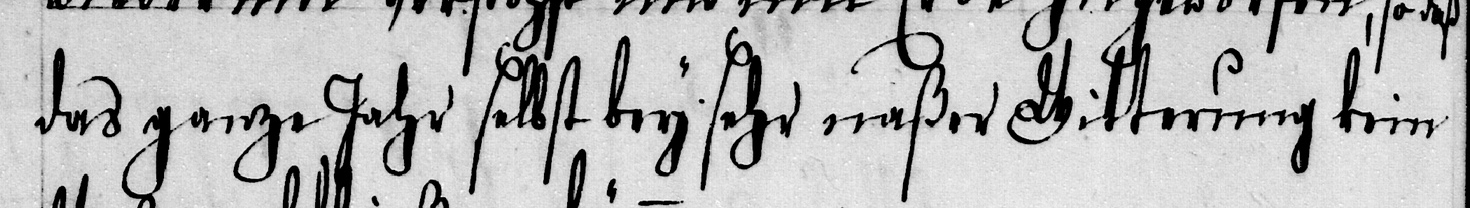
das ganze Jahr selbst bey sehr naßer Witterung kein
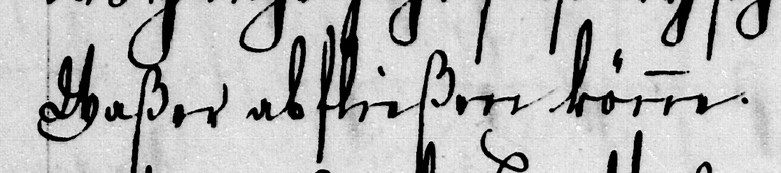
Waßer abfließen könne.
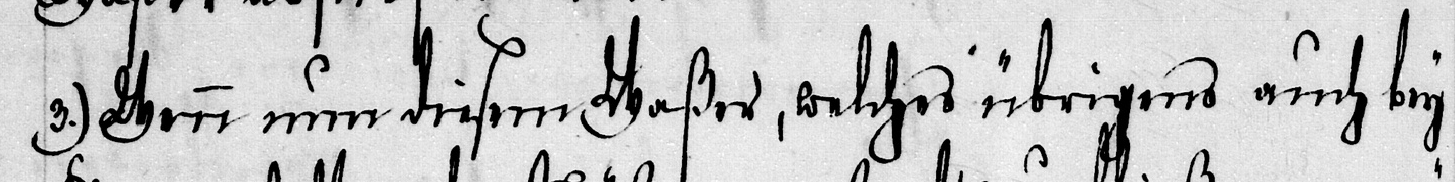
3.) Wenn nun diesem Waßer, welches übrigens auch bey
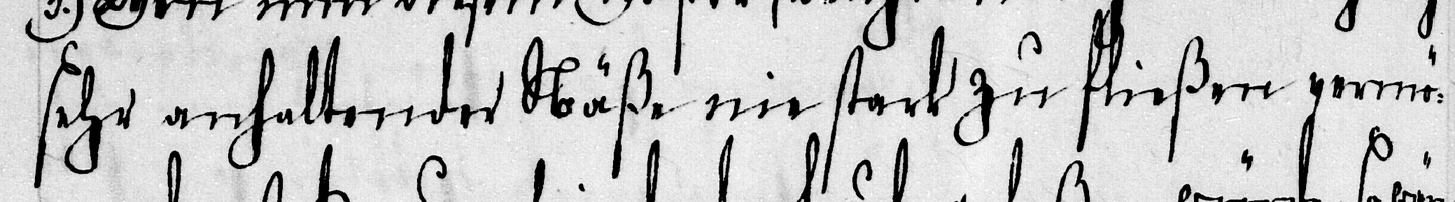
sehr anhaltender Näße nie stark zu fließen vermö¬
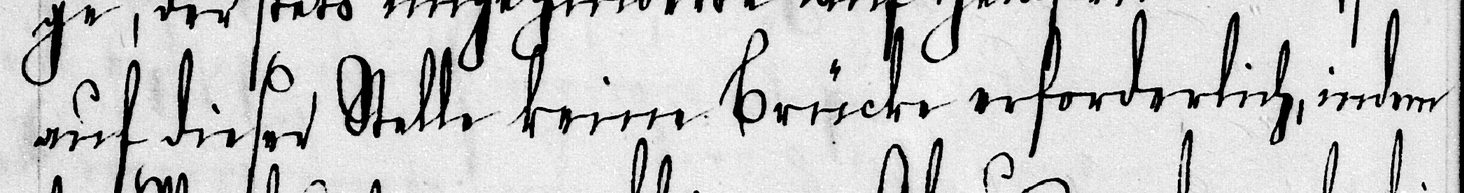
auf dieser Stelle keine Brücke erforderlich, indem
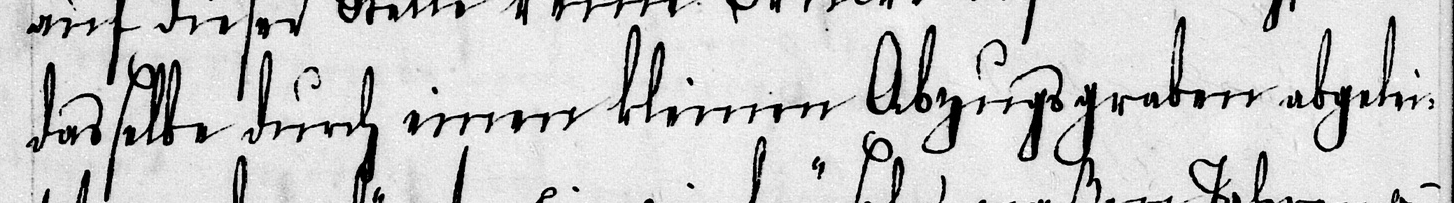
dasselbe durch einen kleinen Abzugsgraben abgelei¬
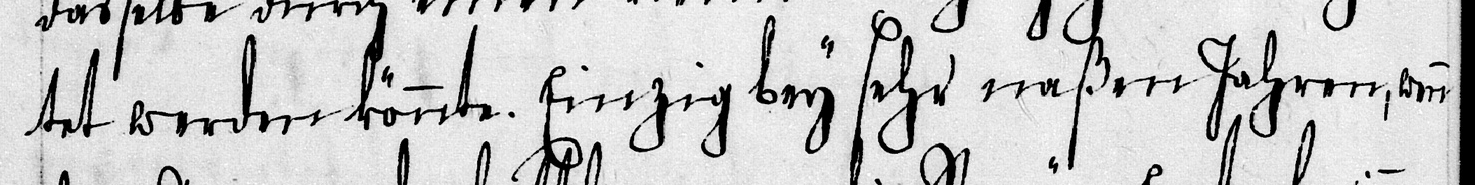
tet werden könnte. Einzig bey sehr naßen Jahren, w¬
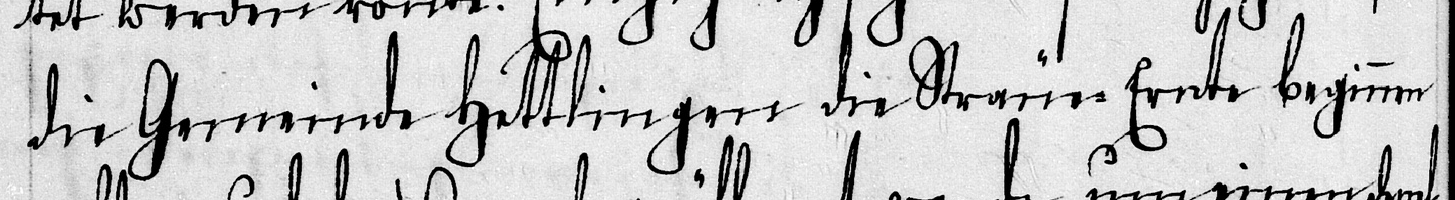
die Gemeinde Hettlingen die Sträue-Ernte beginn¬
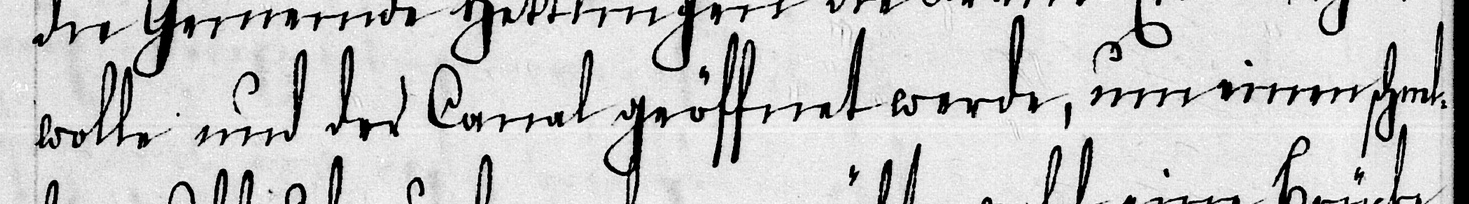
wolle und der Canal geöffnet werde, um einen schn¬
